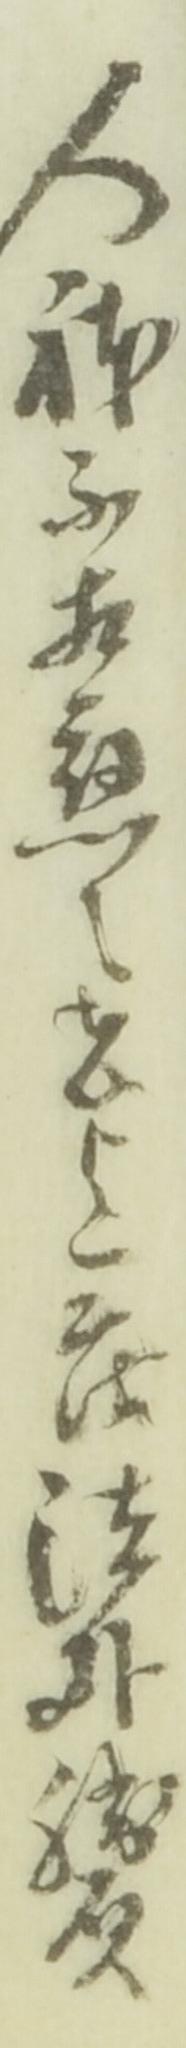人躰不相応候者迄も法外勝負
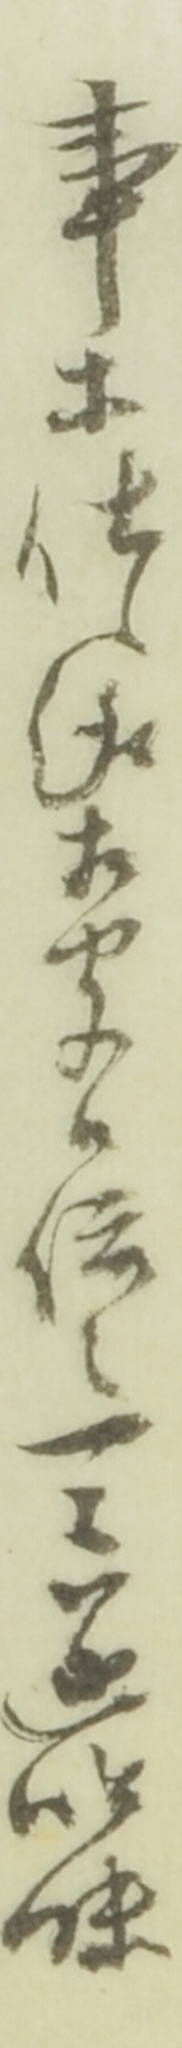事等仕候趣相聞候依之一々遂吟味
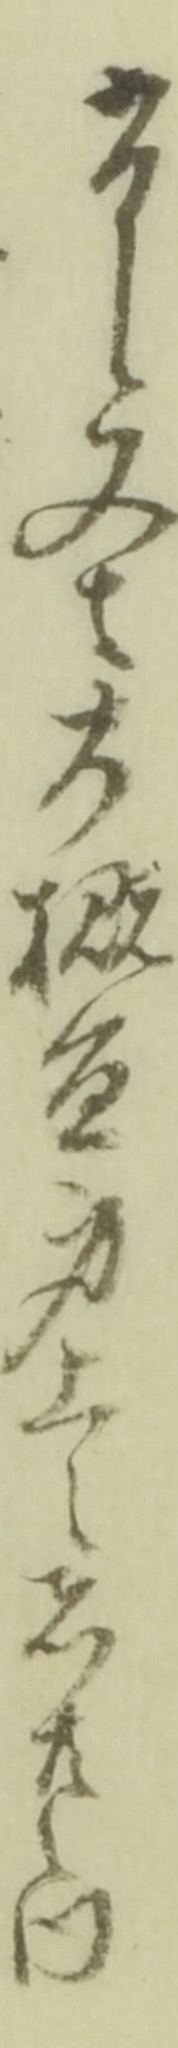有之候又者大概亘身上之者共之内
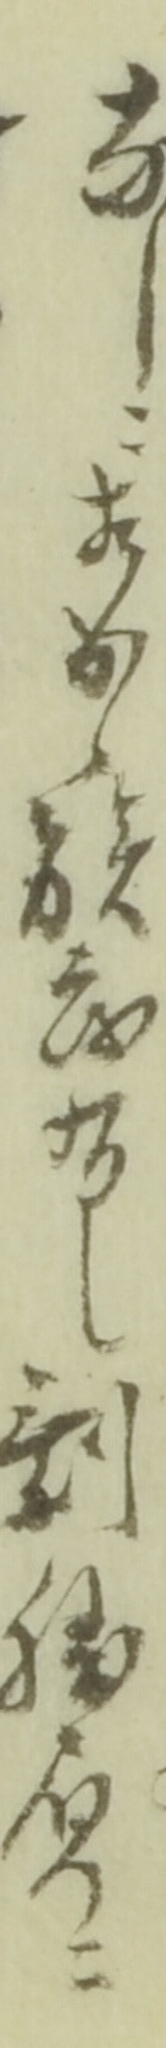なし二相成候族茂有之剰勝負二
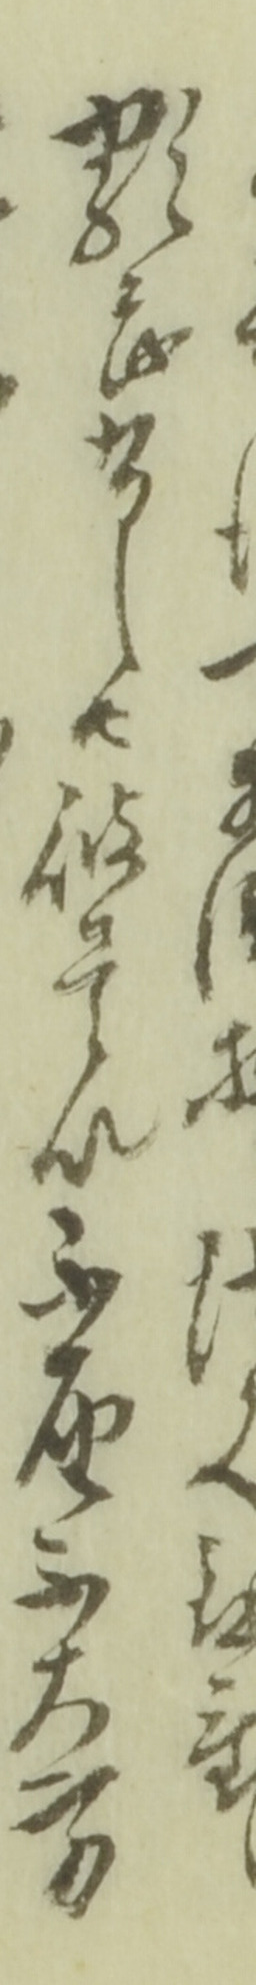類茂有之候共彼是以不届不大方
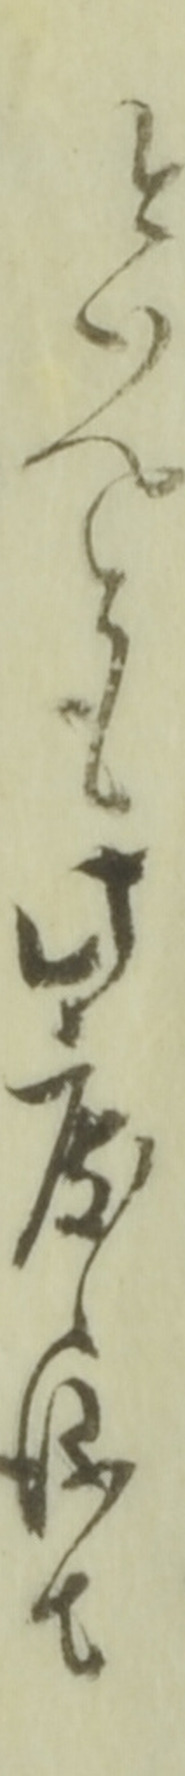といへとも此度之儀者
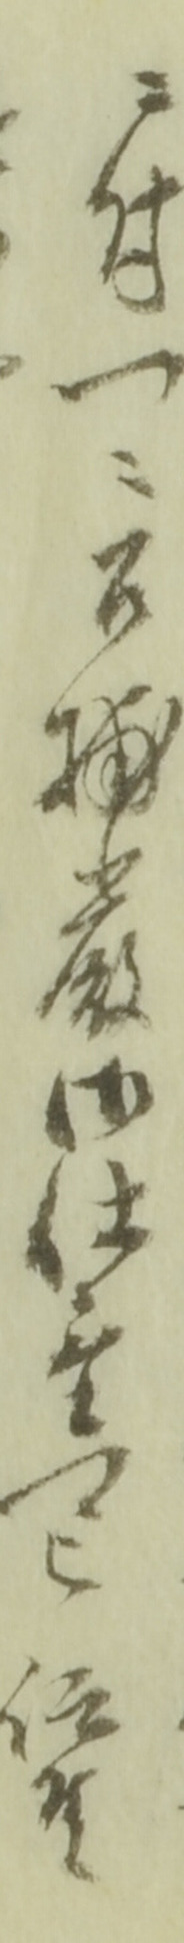二付一々召捕厳御仕置可被仰付候
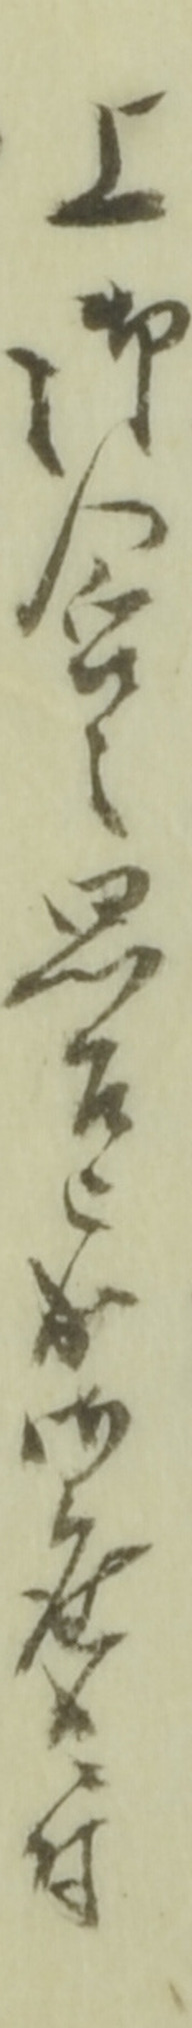上御僉之思召被成御座候二付
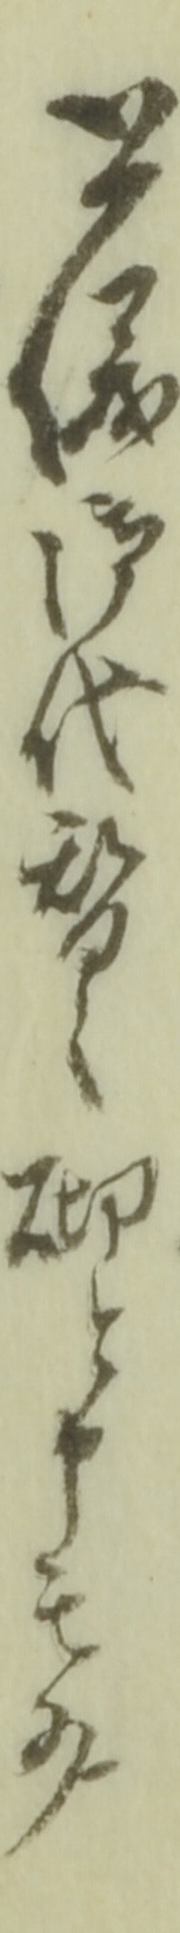公儀御代替之砌と申其外
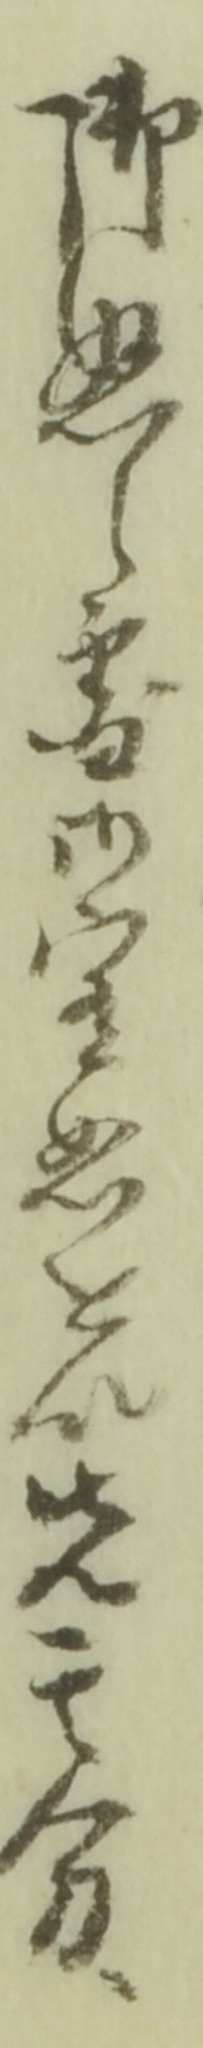御怒候處御寛恕を以先其分へ
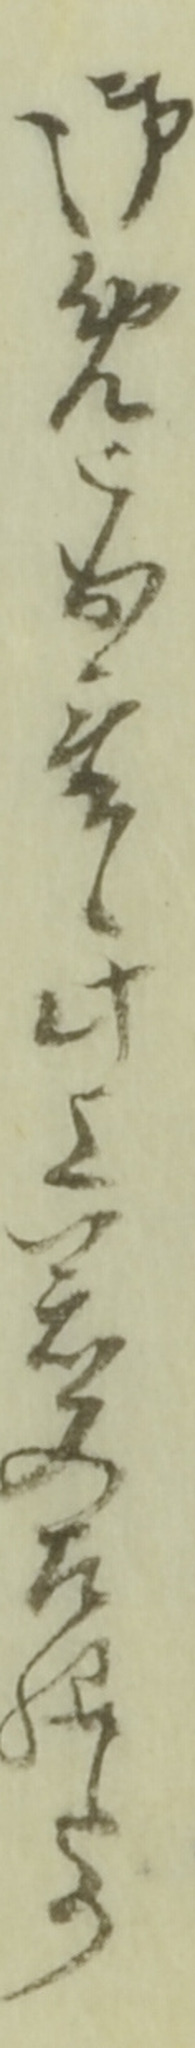御免被成置候此上若又左様
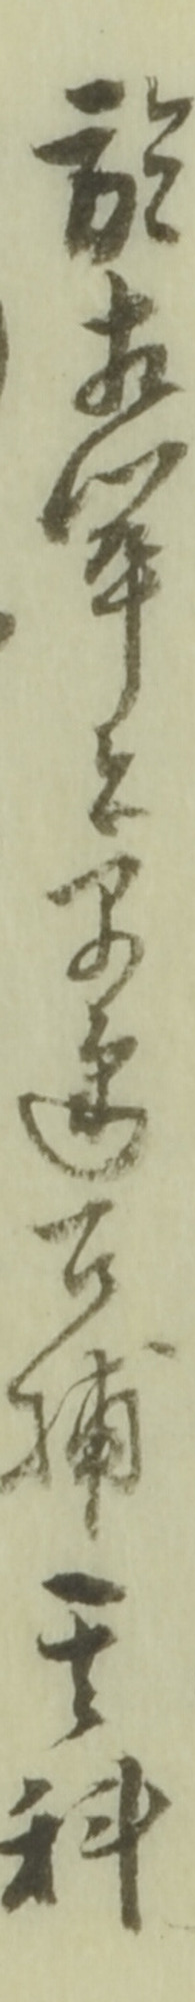於相心違者早速召捕其科
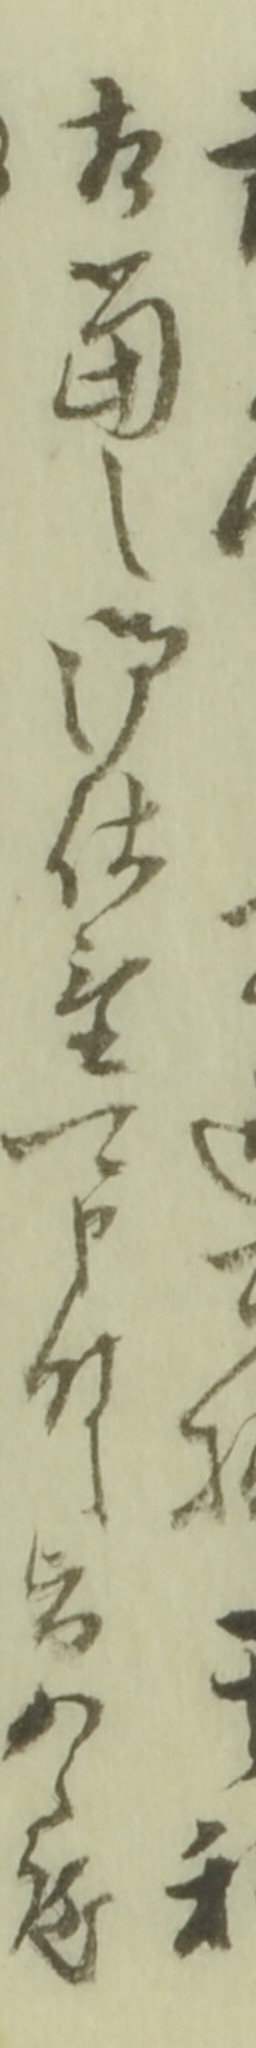相留候御仕置可申付候旨かの御
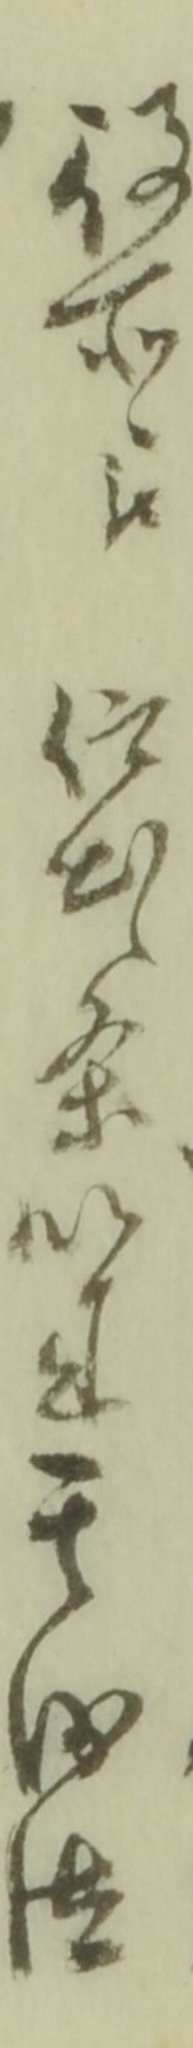役所へ被仰出候条以来其儀仰
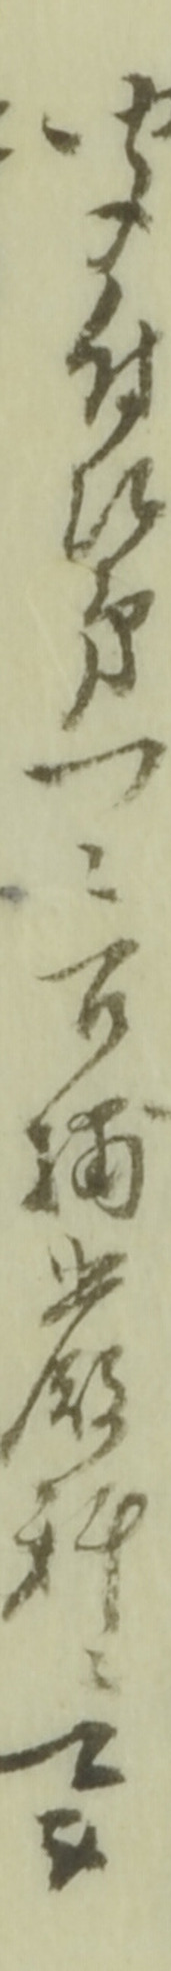聞付次第一ツ召捕厳科二可被
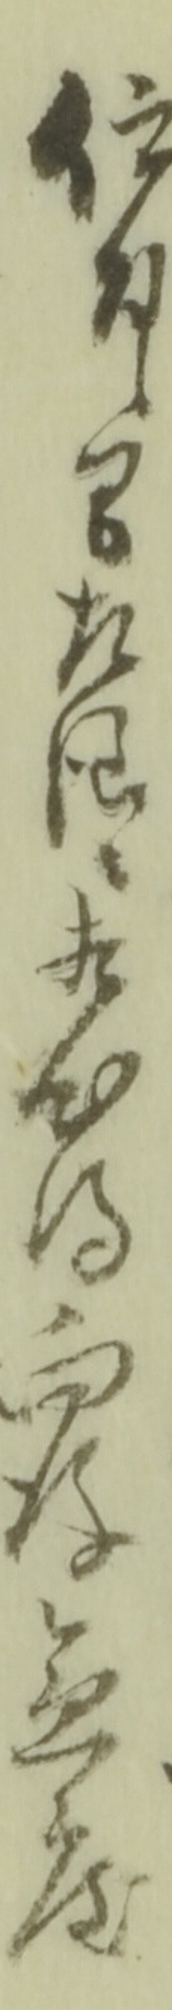仰付候間左様二相心得向後急度
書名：御公儀様御領主様御触書控
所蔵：伊那市立高遠町図書館・合同会社AMANE
